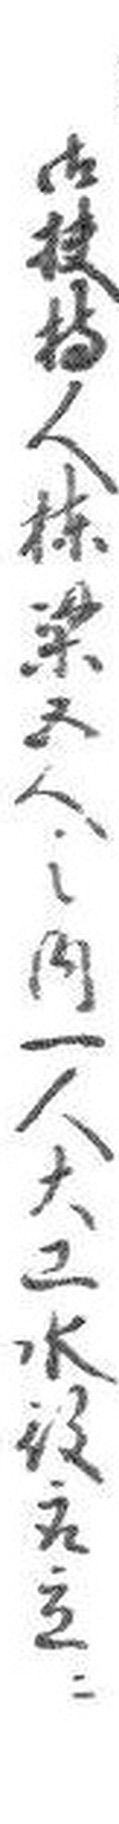御扶持人棟梁五人之内一人大工水役取立ニ
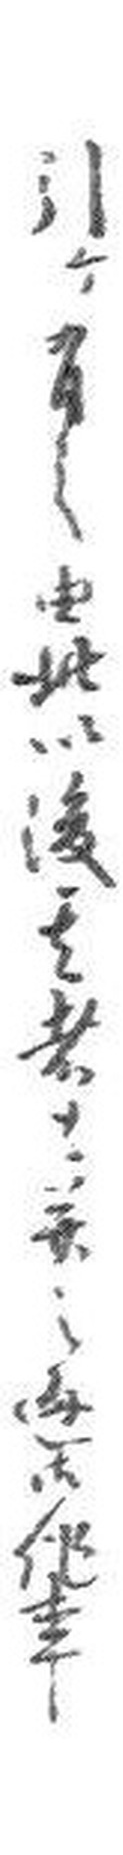引ケ有之由此以後其者も並之通御作事
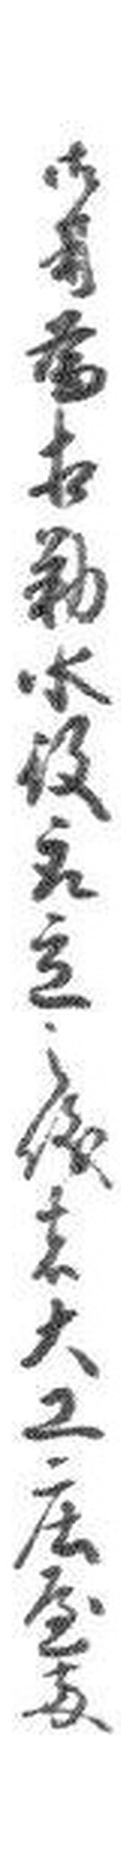御用為相勤水役取立之儀者大工庄屋両
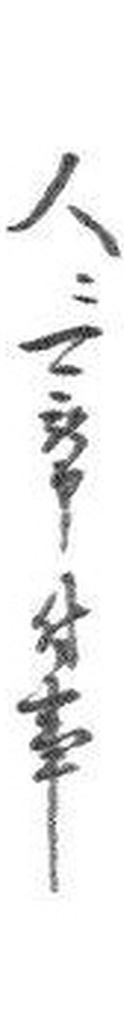人ニ可被申付事
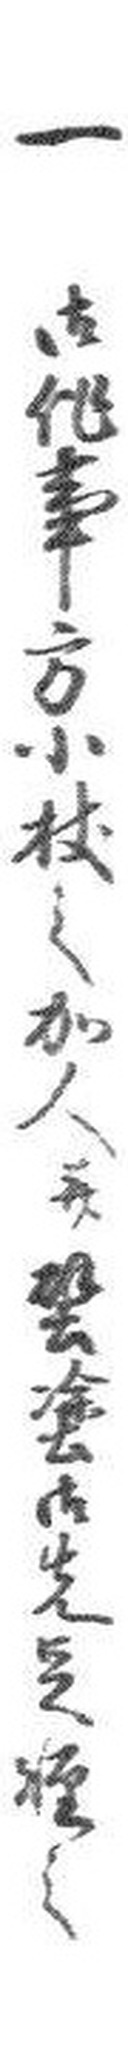一御作事方小杖之加人并壁塗御先足軽之
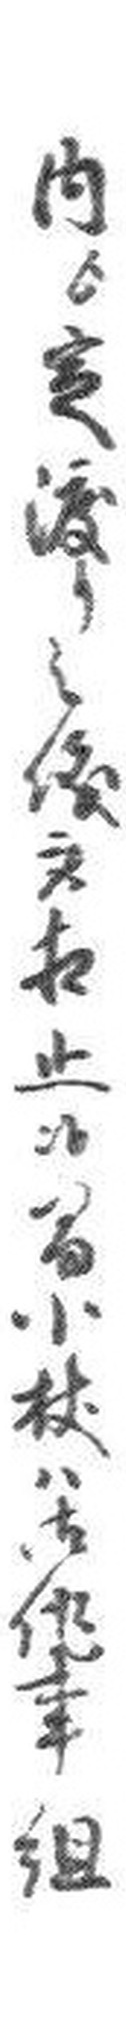内ゟ定渡り之儀被相止候間小杖ハ御作事組

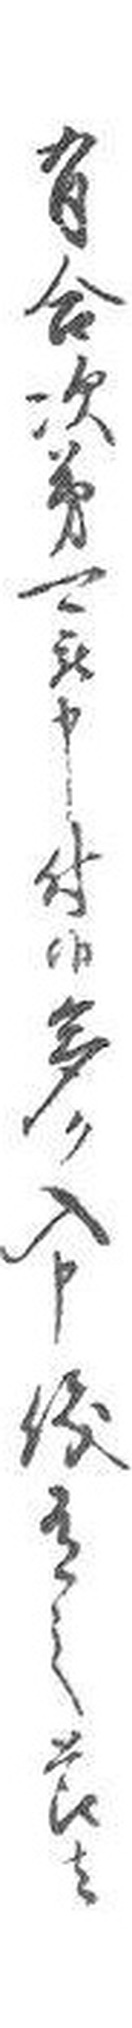有合次第可被申付候多ク入申儀有之儀節者
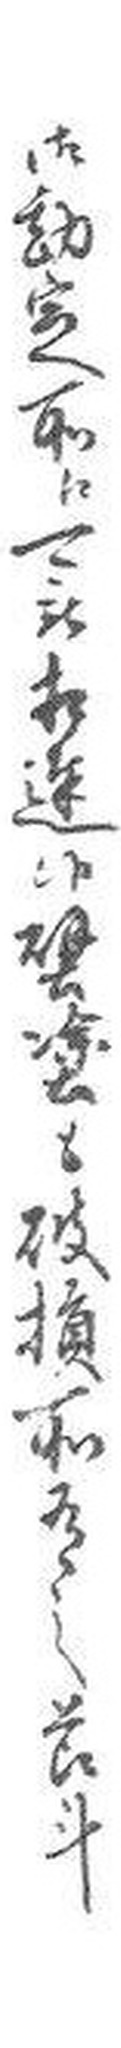御勘定所江可被相達候壁塗も破損所有之節計
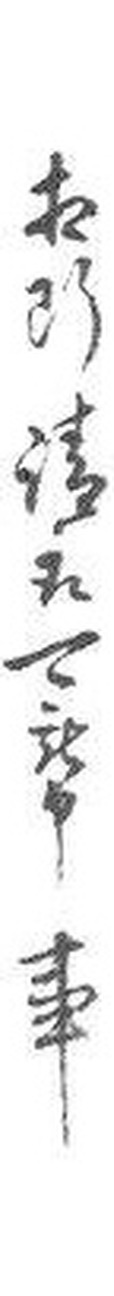相断請取可被申事
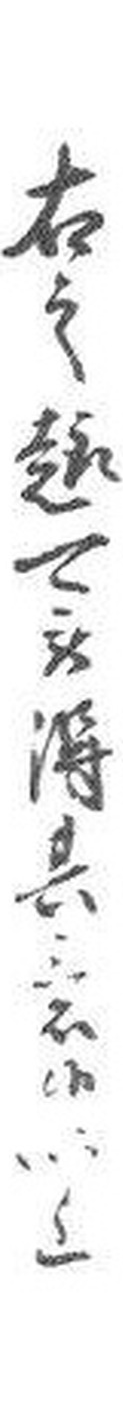右之趣可被得其意候以上
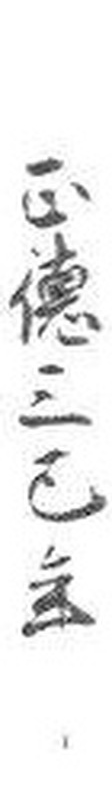正徳三巳年
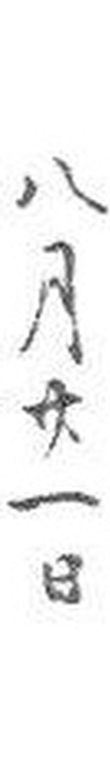八月廿一日
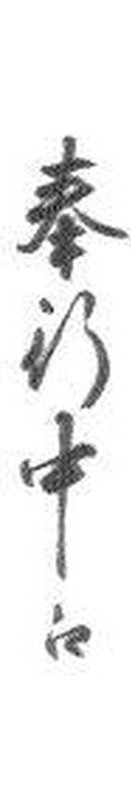奉行中江
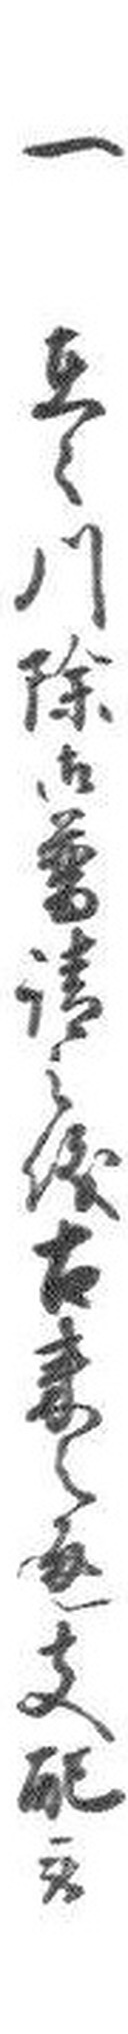一在々川除御普請之儀古来之通支配被
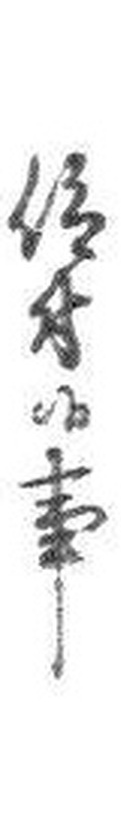仰付候事
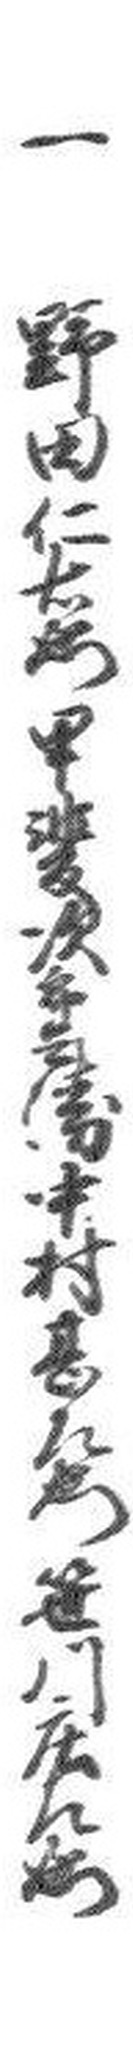一野田仁右衛門甲斐次郎兵衛中村甚左衛門笹川庄左衛門
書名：家譜 二十九 吉邦公 従正徳二年到正徳三年
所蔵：福井県文書館 Fukui Prefectural Archives
